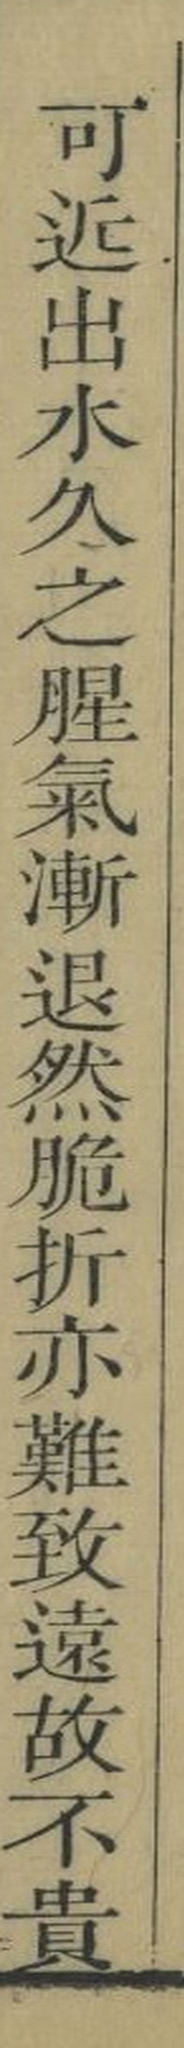可近出水久之腥気漸退然脆折亦難致遠故不貴
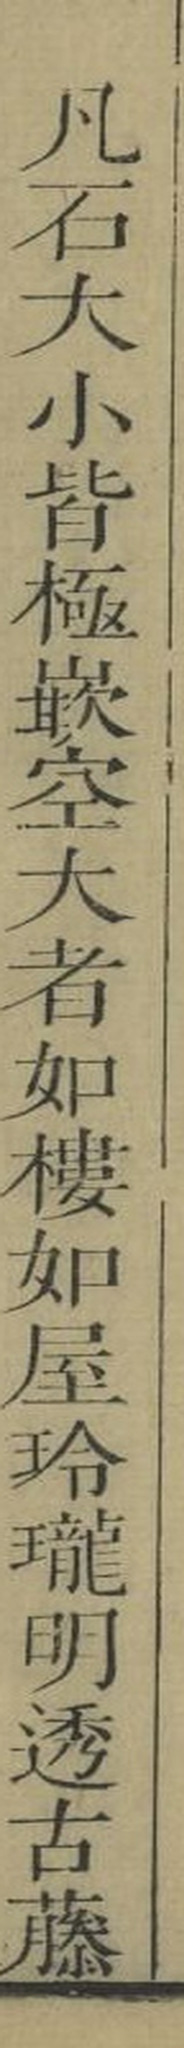凡石大小皆極嵌空大者如楼如屋玲瓏明透古藤
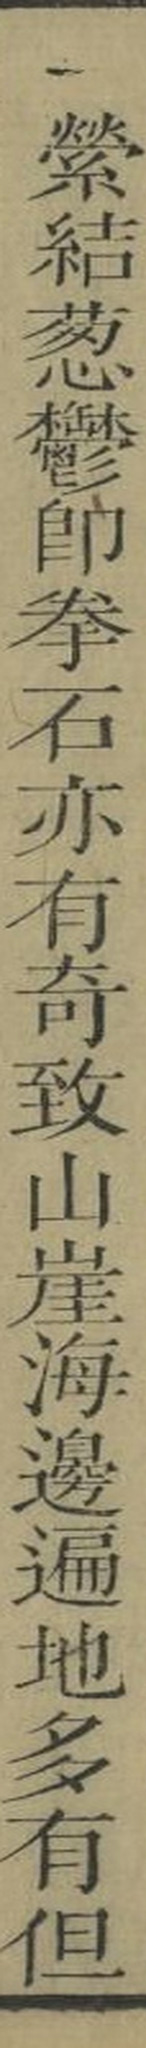縈結葱鬱即拳石亦有奇致山崖海辺遍地多有但
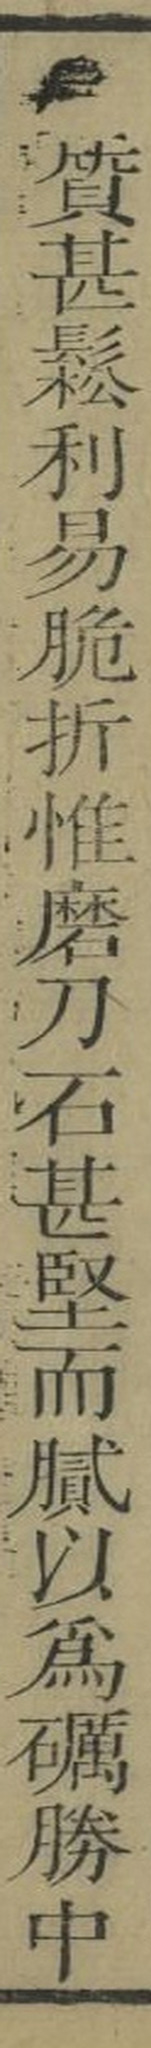質甚鬆利易脆折惟磨刀石甚堅而膩以為礪勝中
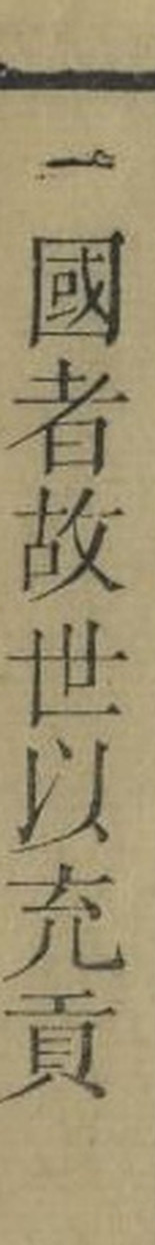国者故世以充貢

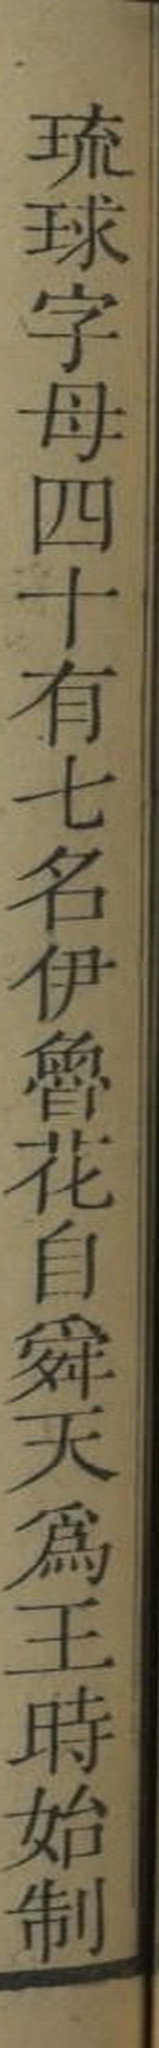琉球字母四十有七名伊魯花自舜天為王時始制
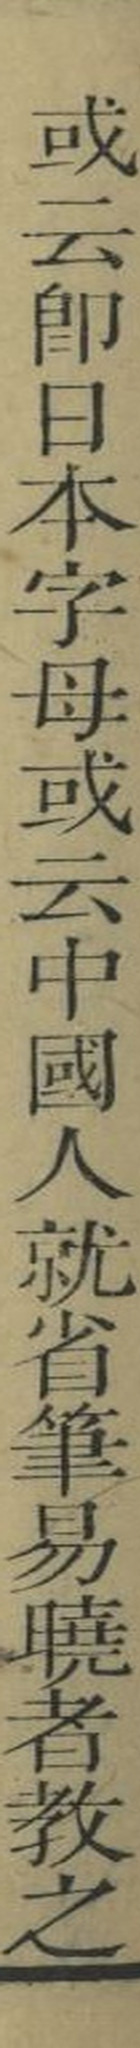或云即日本字母或云中国人就省筆易暁者教之
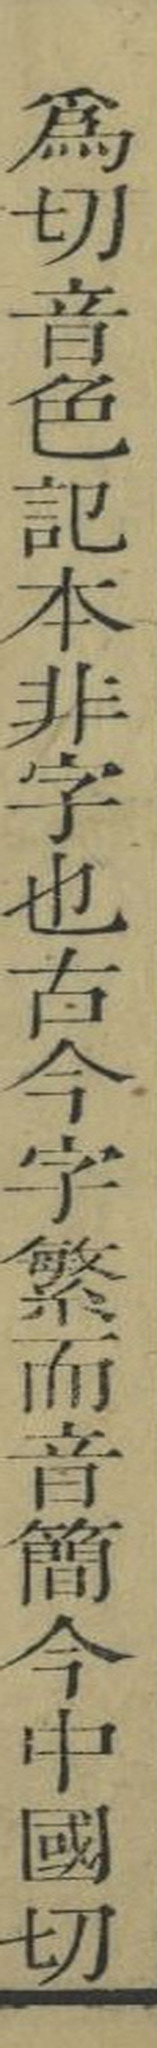為切音色記本非字也古今字繁而音簡今中国切
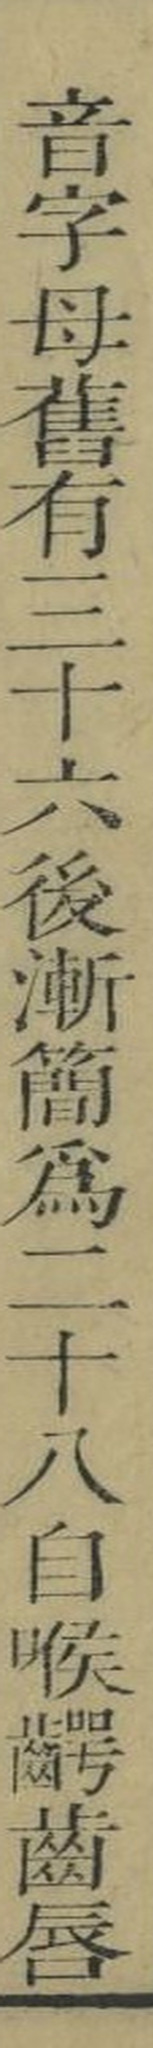音字母旧有三十六後漸簡為二十八自喉齶歯唇
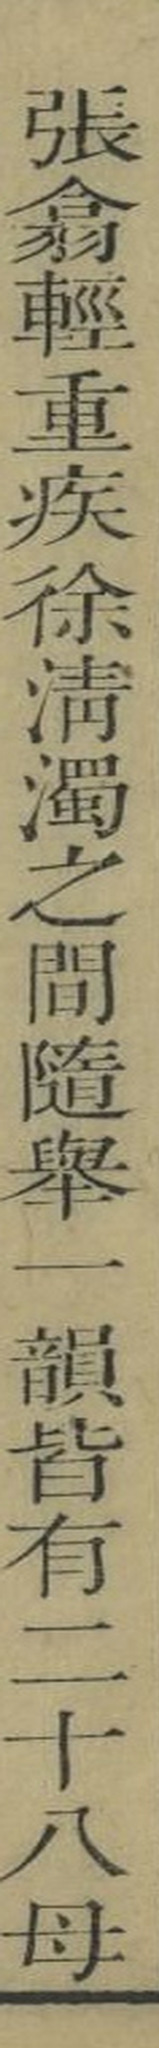張翕軽重疾徐清濁之間随挙一韻皆有二十八母
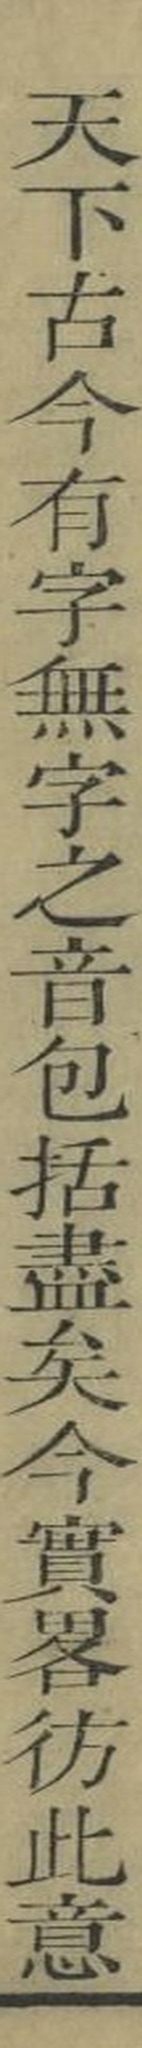天下古今有字無字之音包括尽矣今実略彷此意
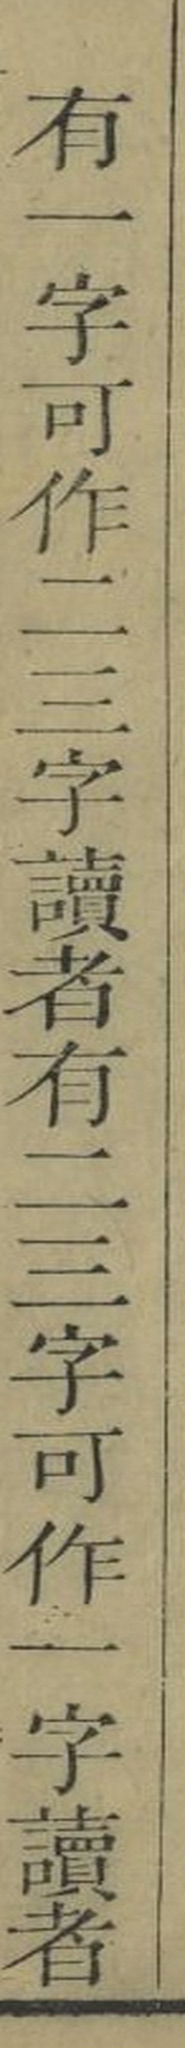有一字可作二三字読者有二三字可作一字読者
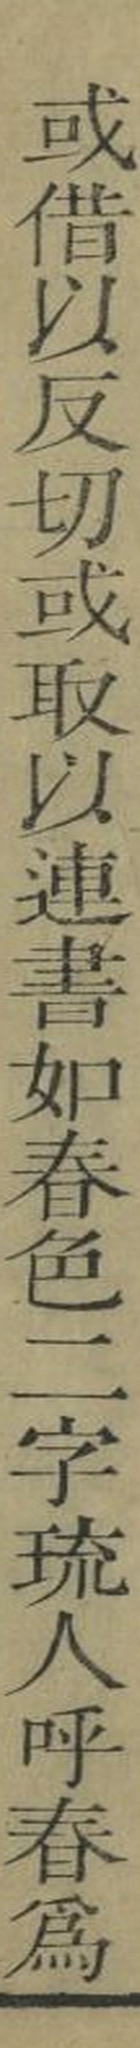或借以反切或取以連書如春色二字琉人呼春為
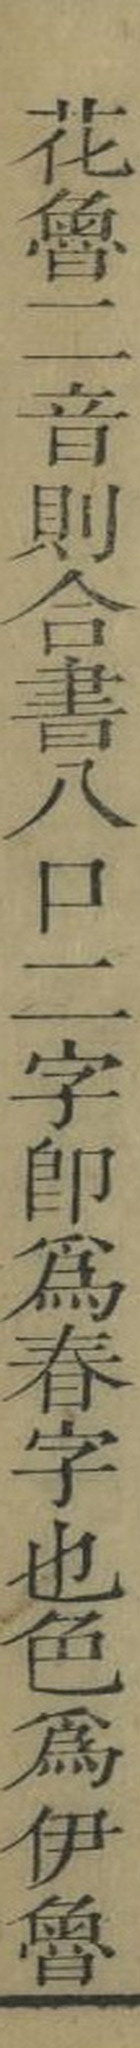花魯二音則合書八口二字即為春字也色為伊魯

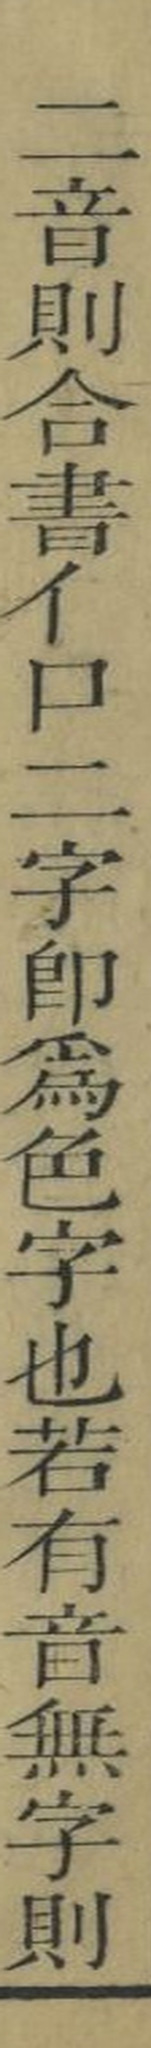二音則合書イロ二字即為色字也若有音無字則
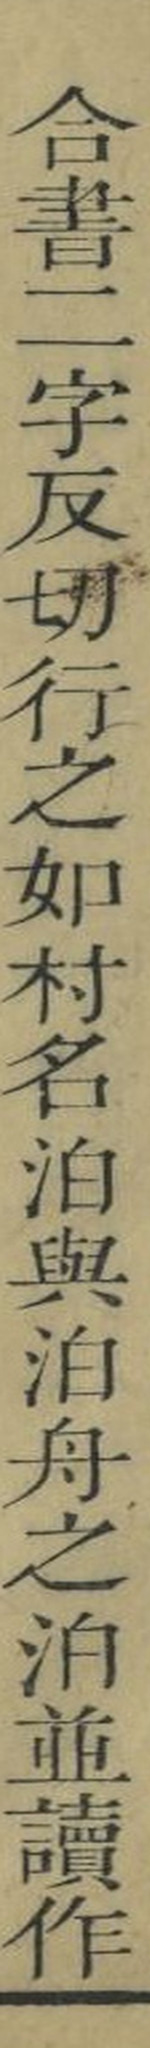合書二字反切行之如村名泊与泊舟之泊並読作
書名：中山伝信録 巻六
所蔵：University of the Ryukyus Library
